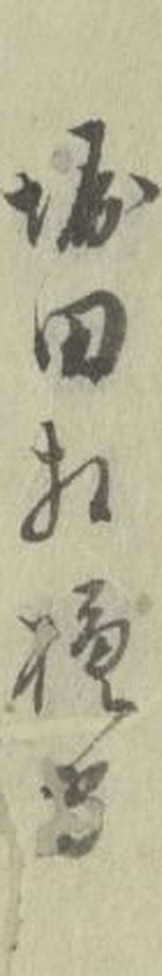堀田相模守
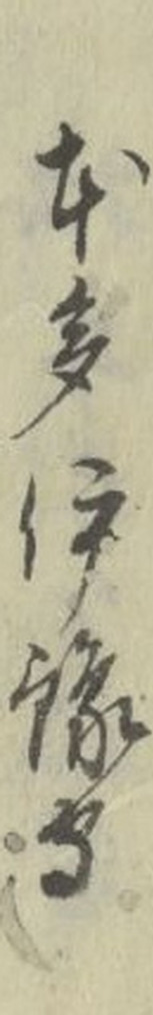本多伊予守
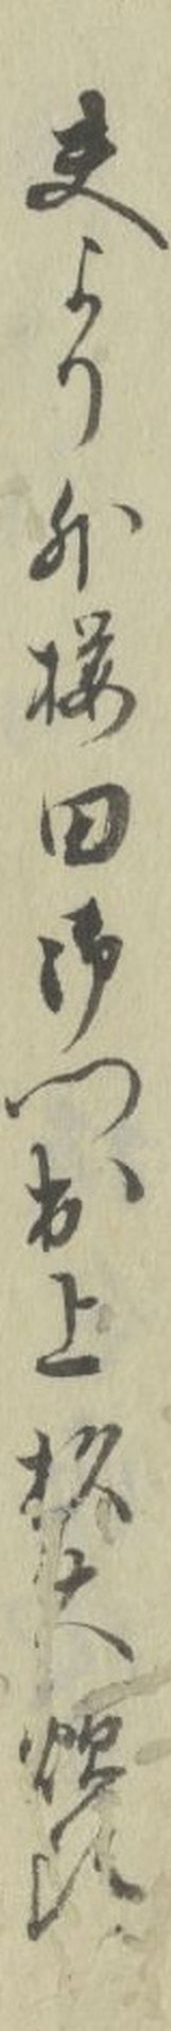夫より外桜田御門出上杉大炊頭
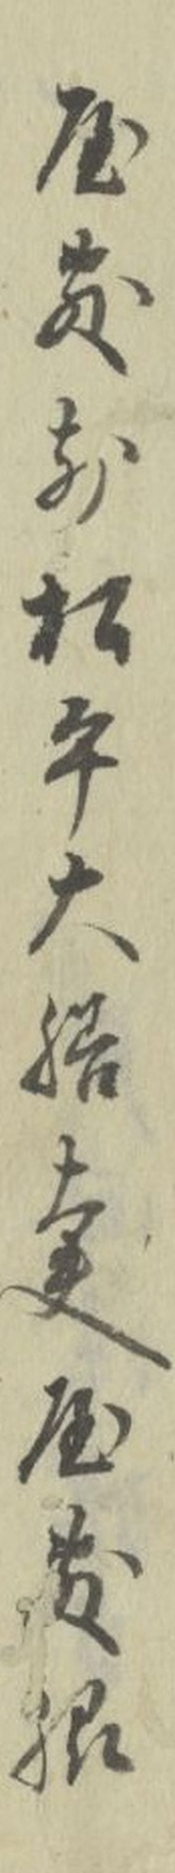屋敷前松平大膳大夫屋敷脇
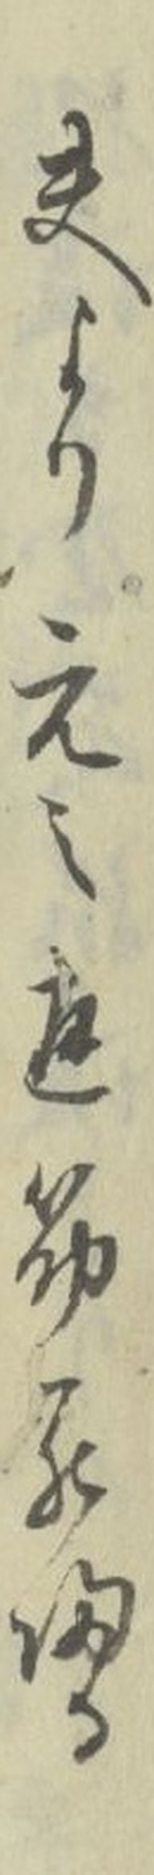夫より元之通筋罷帰る
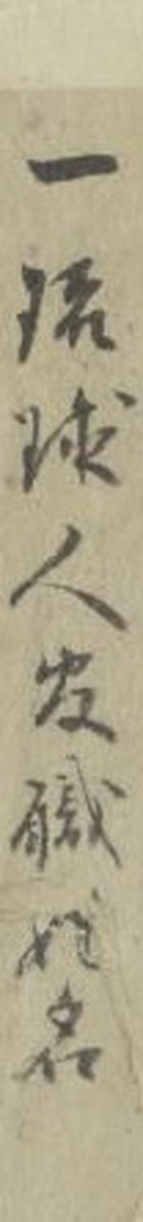一琉球人官職和名
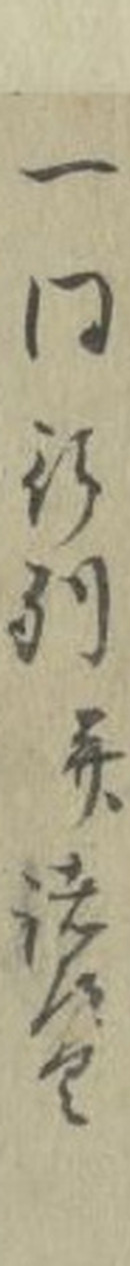一同行列幷諸道具
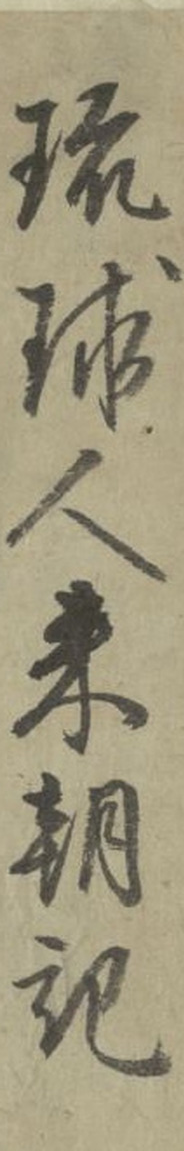琉球人来朝記四

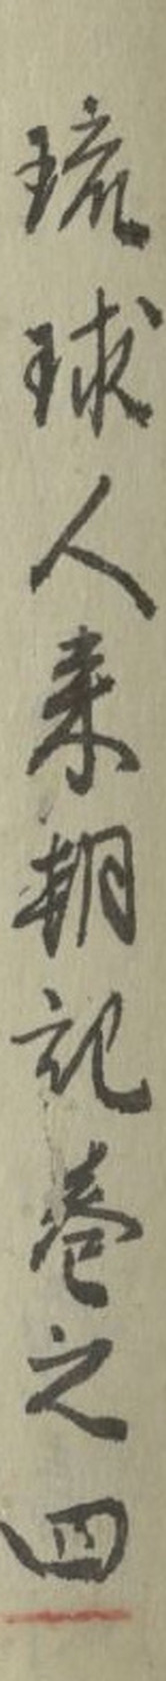琉球人来朝記巻之四
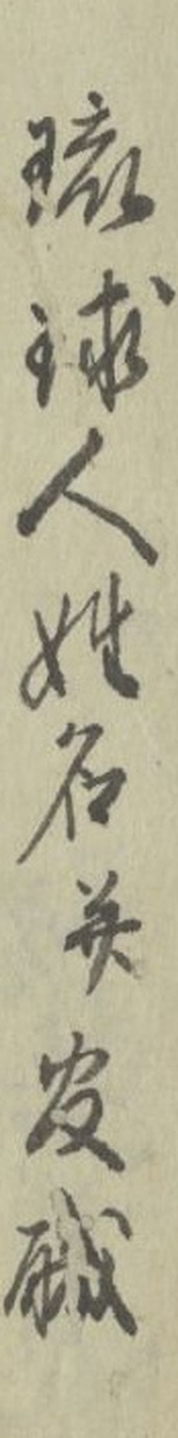琉球人姓名幷官職

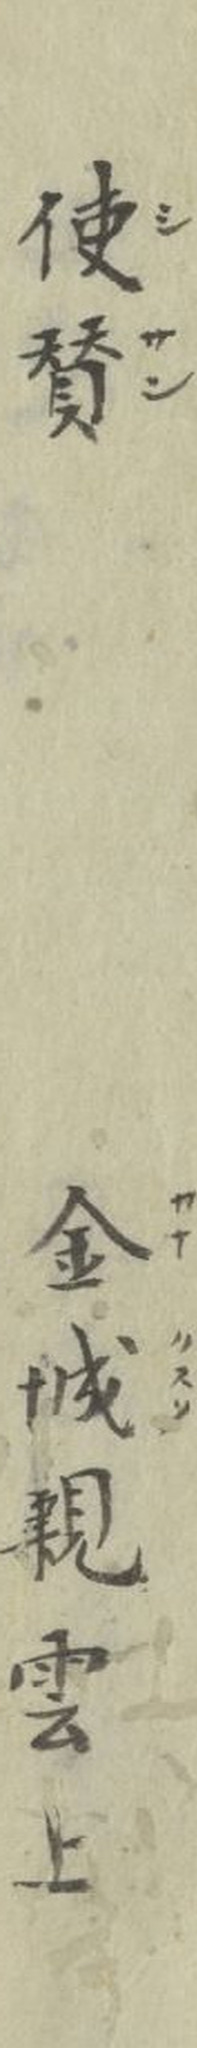使賛金城親雲上
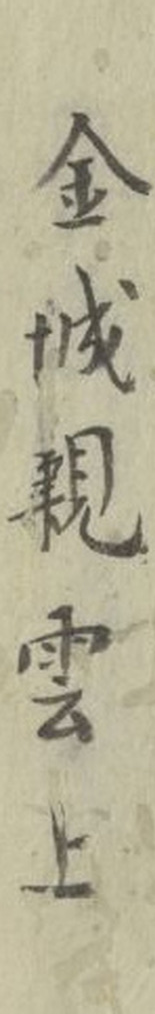使賛金城親雲上
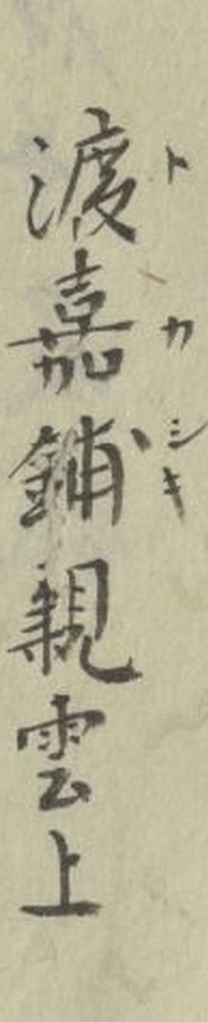渡嘉鋪親雲上
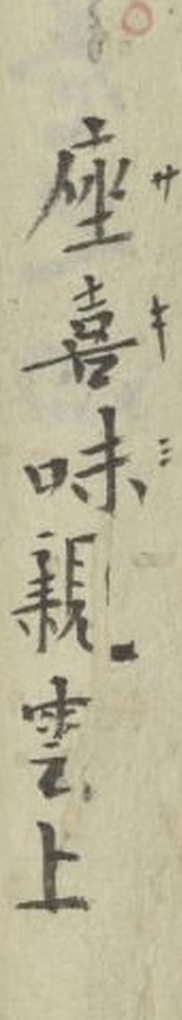座喜味親雲上
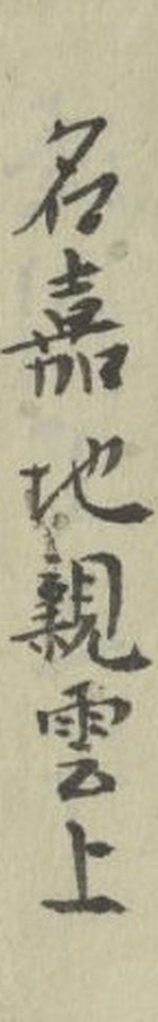名嘉地親雲上
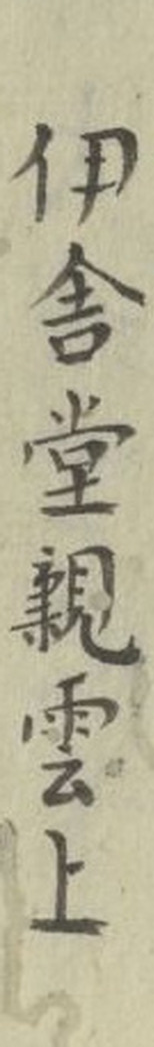伊舎堂親雲上
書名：琉球来朝記 自一至七
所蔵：University of the Ryukyus Library
